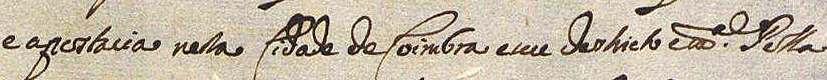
e apostasia nesta Cidade de Coimbra e seu destricto ettc.a Pella
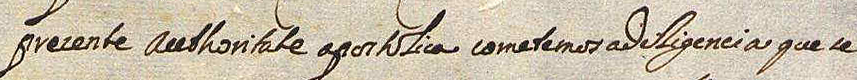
prezente authoritate apostolica cometemos a diligencia que se
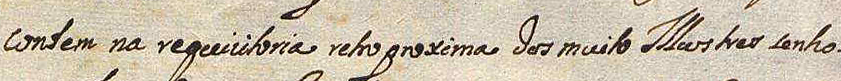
contem na requizitoria retro proxima dos muito Illustres senho
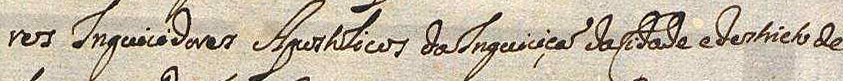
res Inquisidores Apostolicos da Inquisiçaõ da Cidade e destricto de
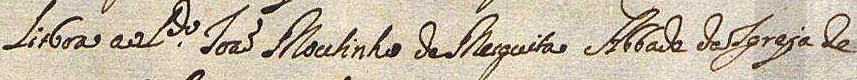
Lisboa ao Ldo. Joaõ Moutinho de Mesquita Abbade da Igreja de
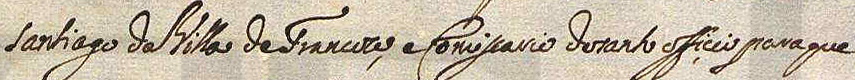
santiago da Villa de Trancozo, e Comissario do santo offiçio para que
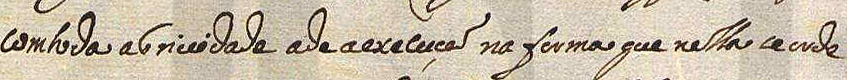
com toda a briuidade a de a execuçaõ na forma que nella se orde
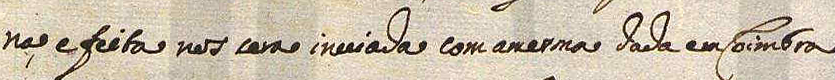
na, e feita nos sera inuiada com a mesma dada em Coimbra
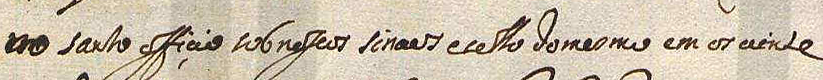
no santo offiçio sob nossos sinaes e sello do mesmo em os uinte
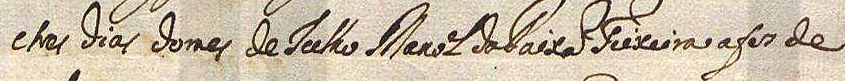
e tres dias do mes de Iulho Manoel da Paixaõ Teixeira a fes de
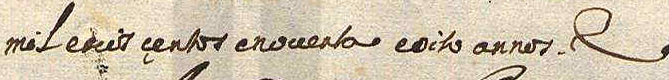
mil e seisçentos e nouenta e oito annos.
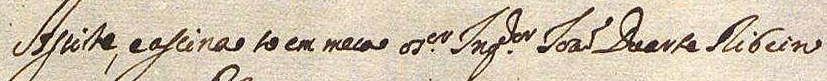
Assiste, e assina so em mesa o s.or Inq.dor Joaõ Duarte Ribeiro
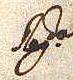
Reg.da
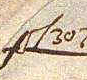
foL 307
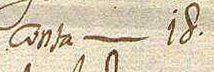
conta ‒ i8.
